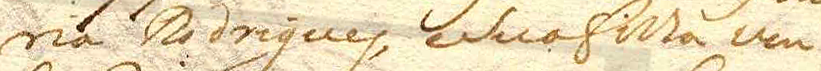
ria Rodrigues, e sua filha ven
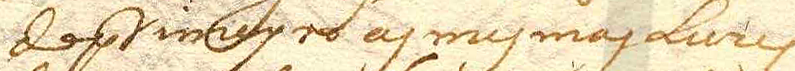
do primeyro as mesmas Luzes
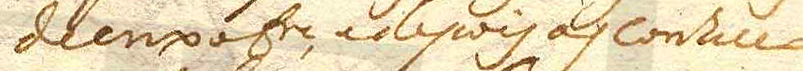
de enxofre, e depois as conheceo
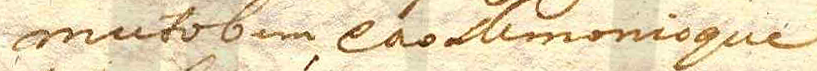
muto bem, e ao Demonio que
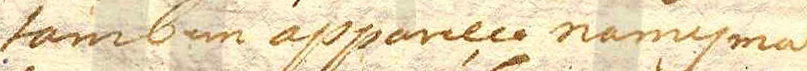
tambem appareçeo na mesma
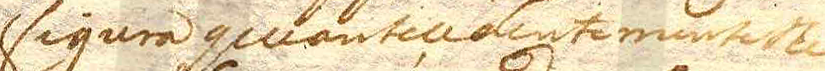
figura que anteçedentemente lhe
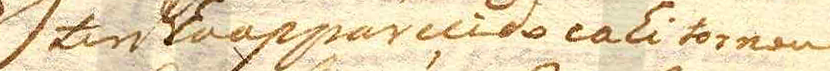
tinha appareçido e ahi tornou
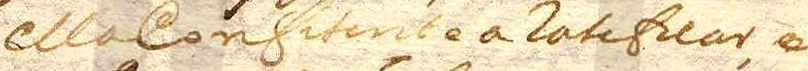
ella Confitente a Rateficar, o
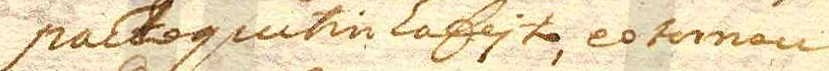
pacto que tinha fejto, e o tornou
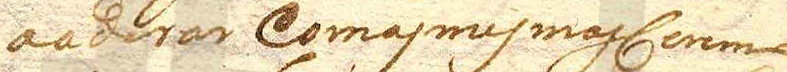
a adorar Com as mesmas Ceremo
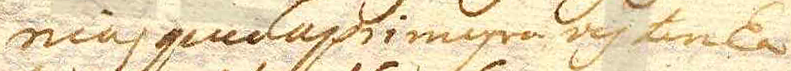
nias que da primeyra ves tinha
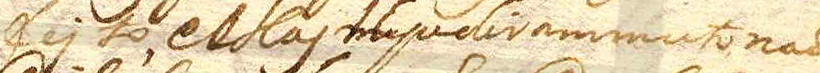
fejto, e ellas lhe pediram muito naõ
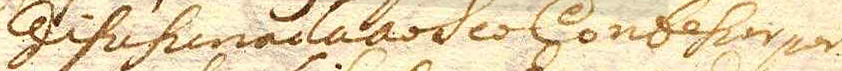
dissesse nada ao Seo Confessor por
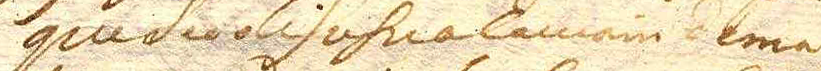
que Se o dissesse a hauiam de ma
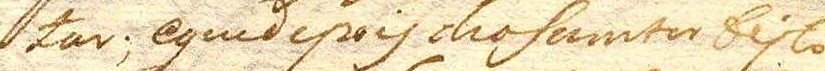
tar; e que depois de assim ter fejto
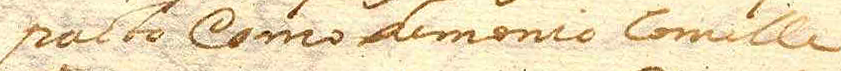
pacto com o demonio com elle
